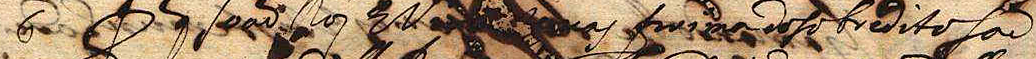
6. Ꝓ q̄ Joaõ Roz̄ E Viol_te uas prima do sobredito saõ
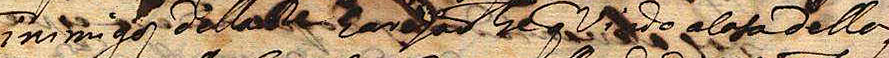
inimigos della Re E a rezão he q̄ Vindo a casa della,
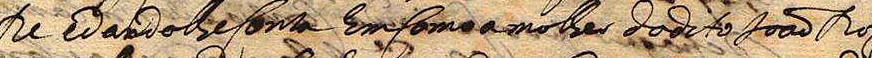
Re e dandolhe Conta Em Como a molher do dito Joaõ Roz̄
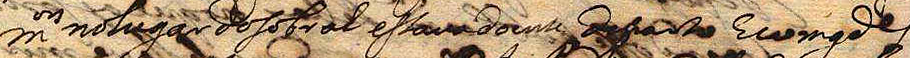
mors no lugar do sobral estaua doente de parto E com gdes
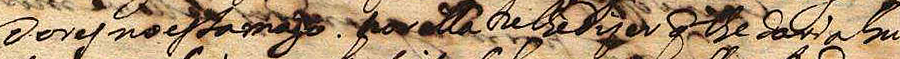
dores no estamago por ella Re lhe dizer q̄ lhe daria hū
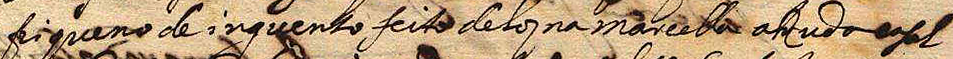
piqueno de inguento feito de lozna marcella aRuda e sal
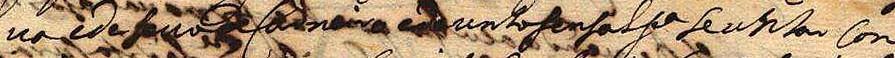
ua e de seuo de Carneiro e de unto sen sal pa se untar com
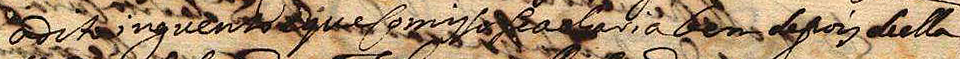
o dito inguento que Com isso se acharia bem depois de ella
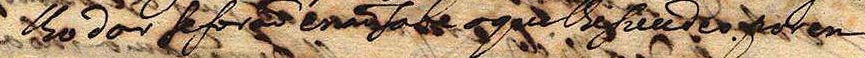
lho dar se foraõ, e naõ sabe o que lhe sucedeo porem
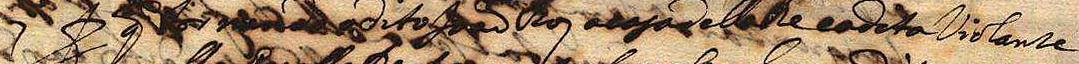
7 Ꝓ q̄ tornando o dito Joaõ Roz̄ a casa della Re e a dita Violante
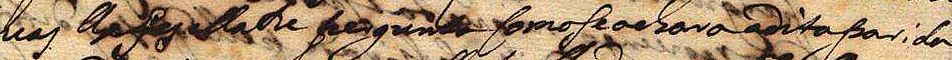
uas lhe fez ella Re pergunta Como se achara a dita parida
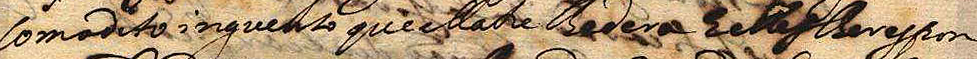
com o dito inguento que ella Re lhe dera E elles lhe respon
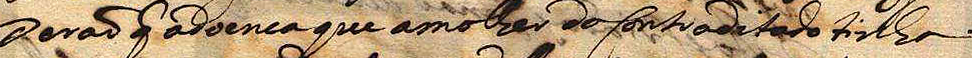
derão q̄ a doença que a molher do Contraditado tinha
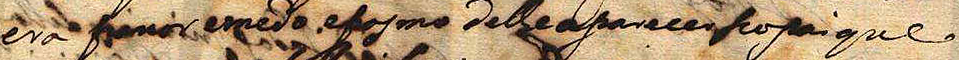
era pauor e medo e pasmo de lhe aparecer seo pai que
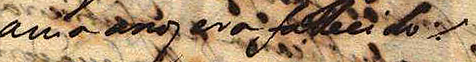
auia anos era fallecido
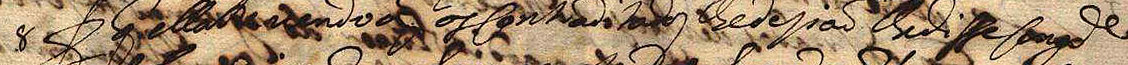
8 Ꝓ q̄ ella Re uendo o q̄ os Contraditados lhe deziaõ lhe disse Con gde
